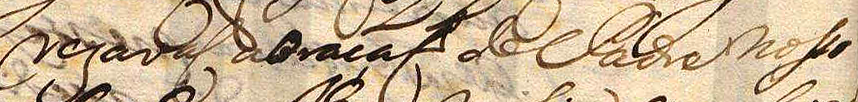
rezavā a oraçā do Padre nosso
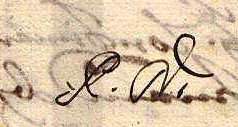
P. N.
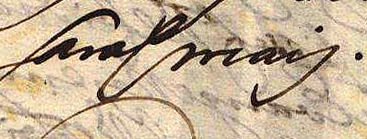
sarā mais.
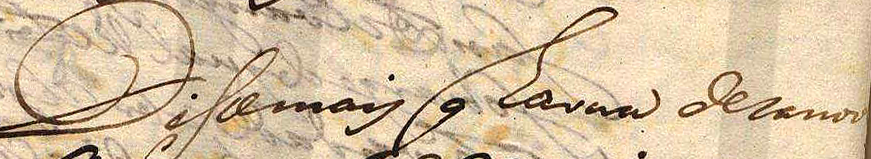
Disse mais q̄ havera dezanov
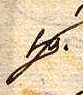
tp.
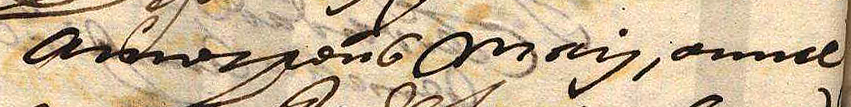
annos pouo mais, ou me
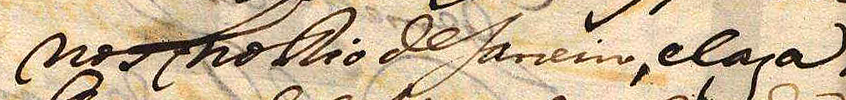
nos no Rio de Janeiro, e caza
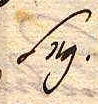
Lug.
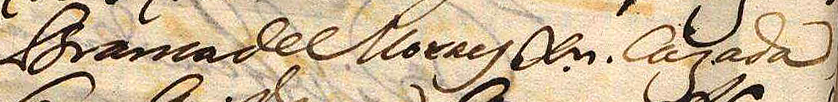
Branca de Morais x.n. cazada
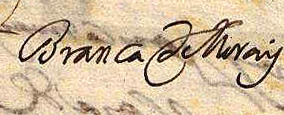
Branca de Morais
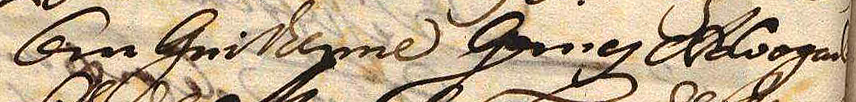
Com Guilherme Gomes Advogad
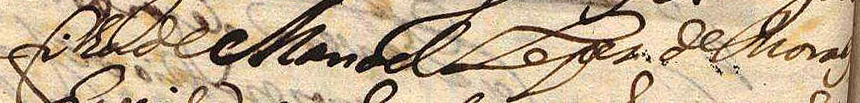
filho de Manoel Lopez de Moraes
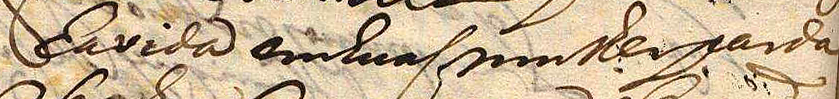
havida em hū mulher parda
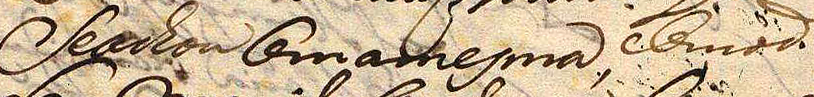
se achou Com a mesma Com o d.
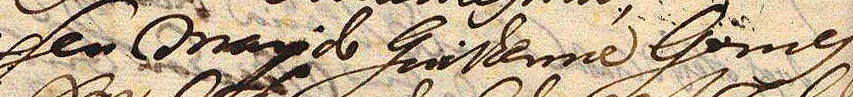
seu marido Guilherme Gomes
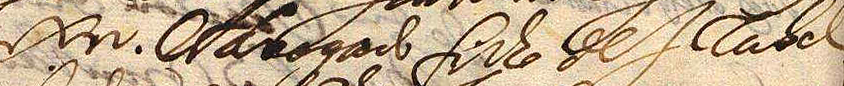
x.n Advogado filho de Jzabel
